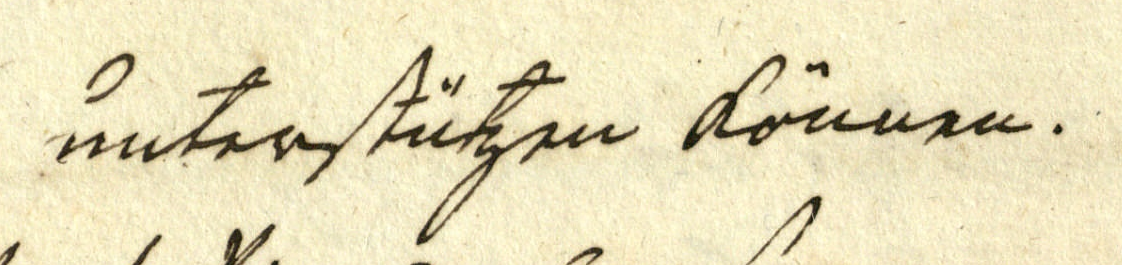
unterstützen können.
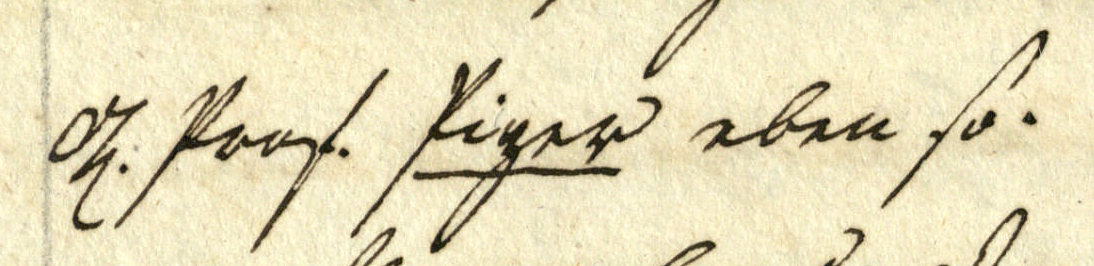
dh. Prof. Piper eben so.
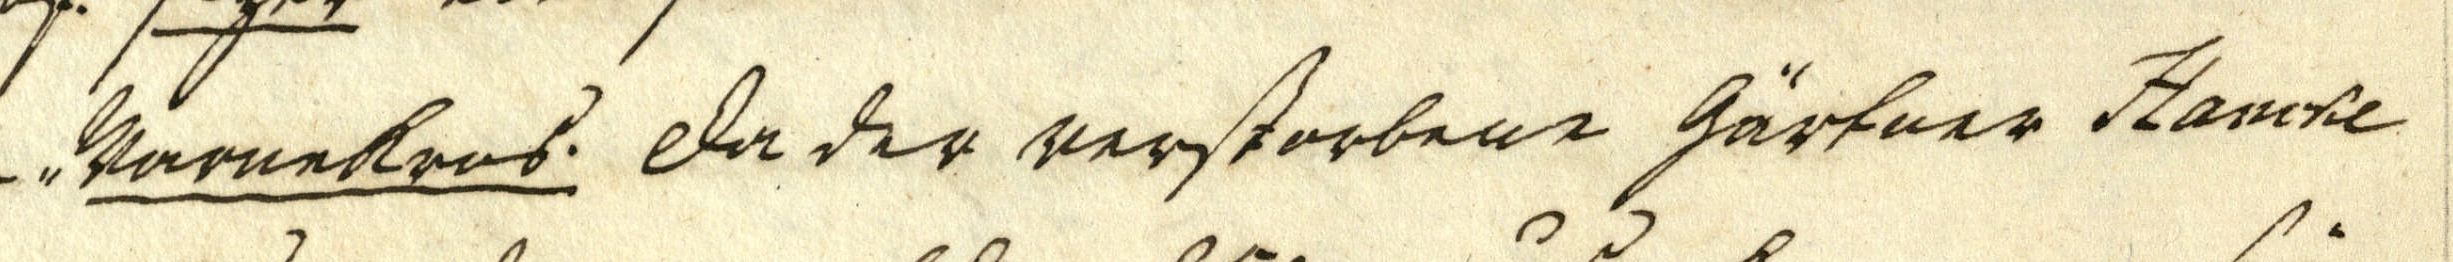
Warnekros. Da der verstorbene Gärtner Hancke
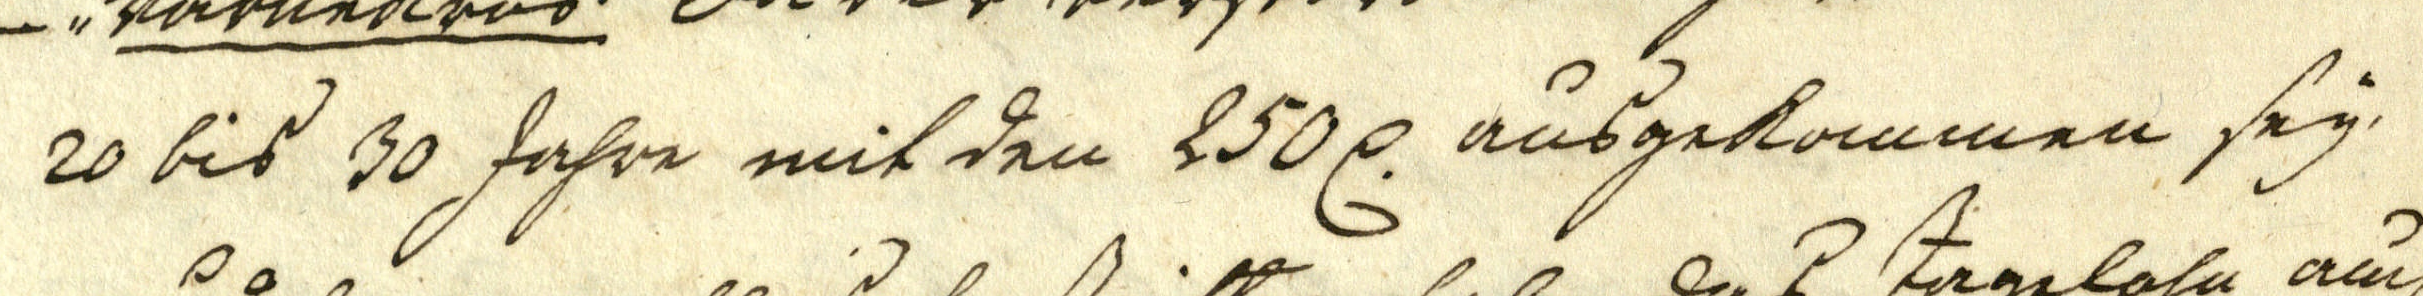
20 bis 30 Jahre mit dem 250 l. ausgekommen seÿ,
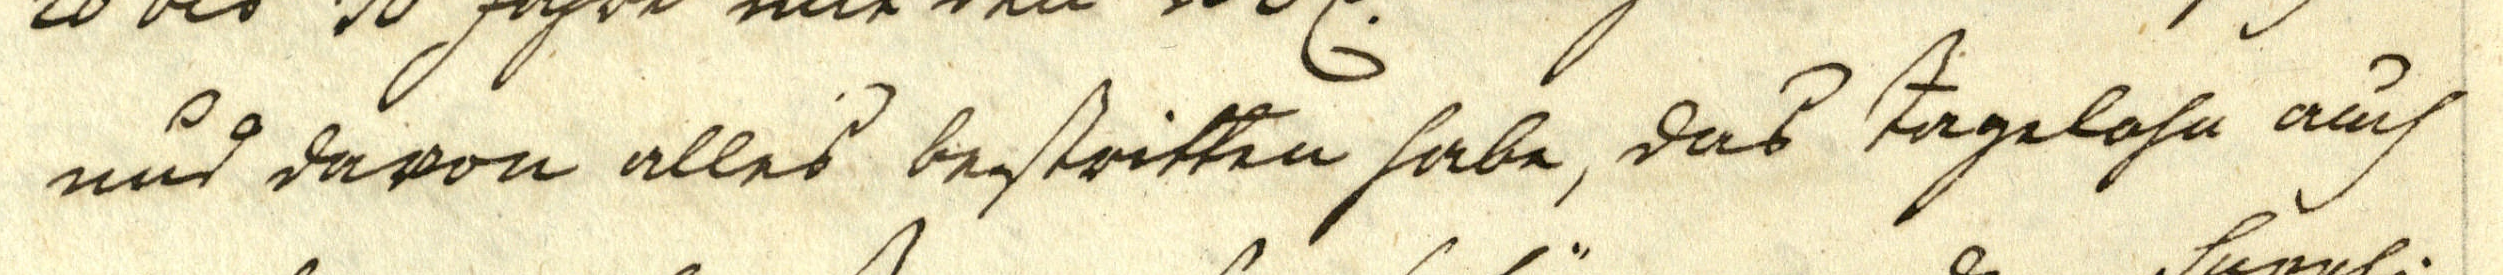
und davon alles bestritten habe, das Tagelohn auch
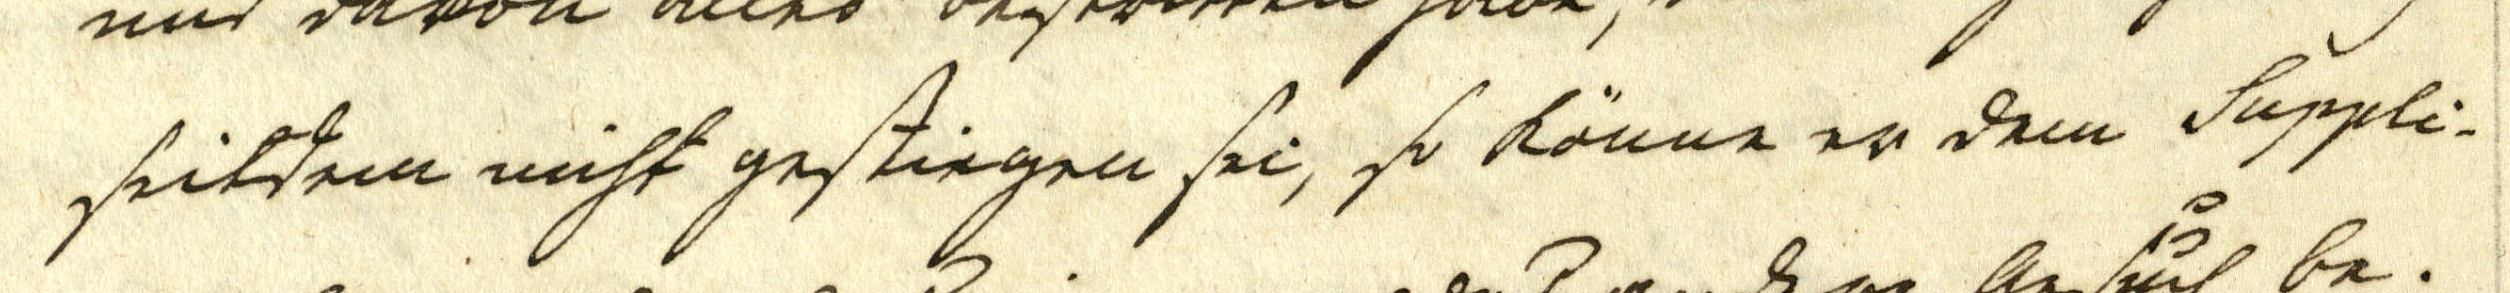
seitdem nicht gestiegen sei, so könne er dem Suppli¬
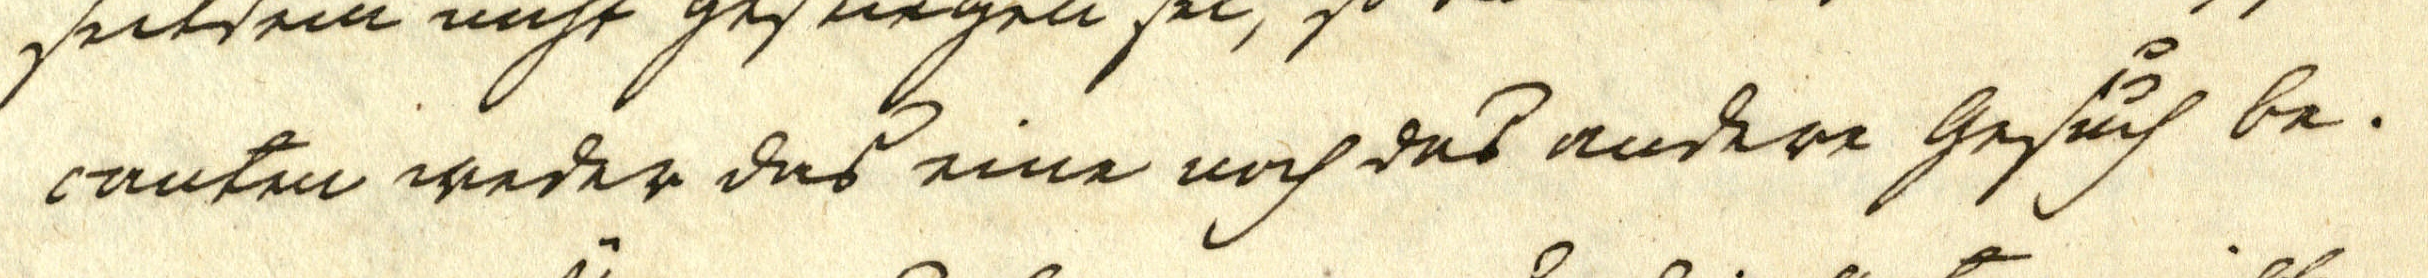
canten weder das eine noch das andere Gesuch be¬
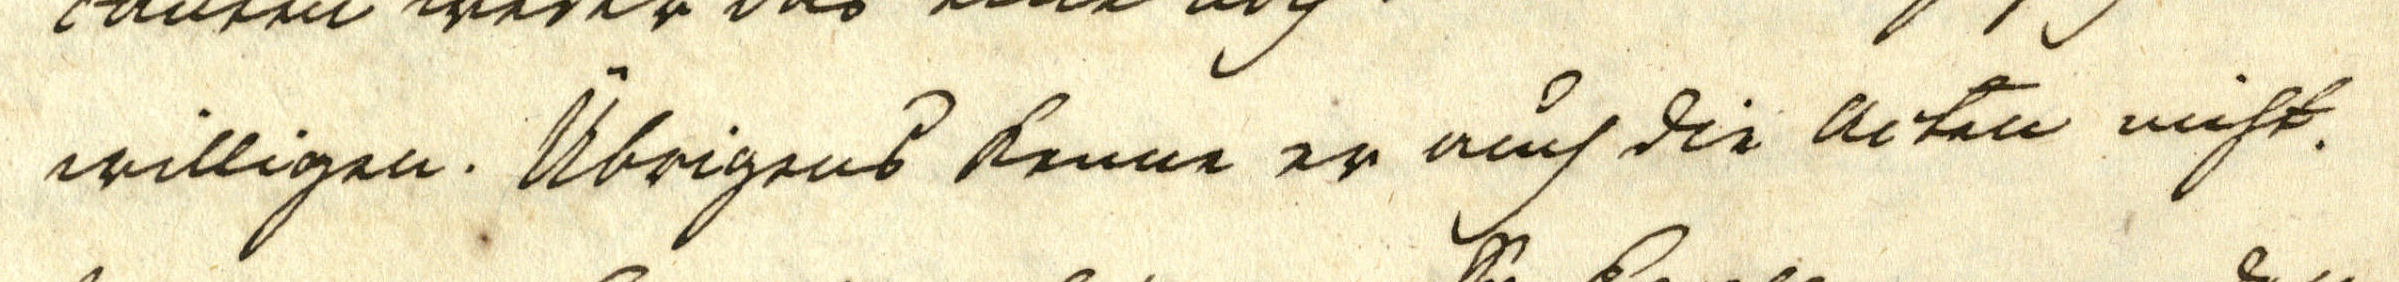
willigen. Übrigens kenne er auch die Acten nicht.
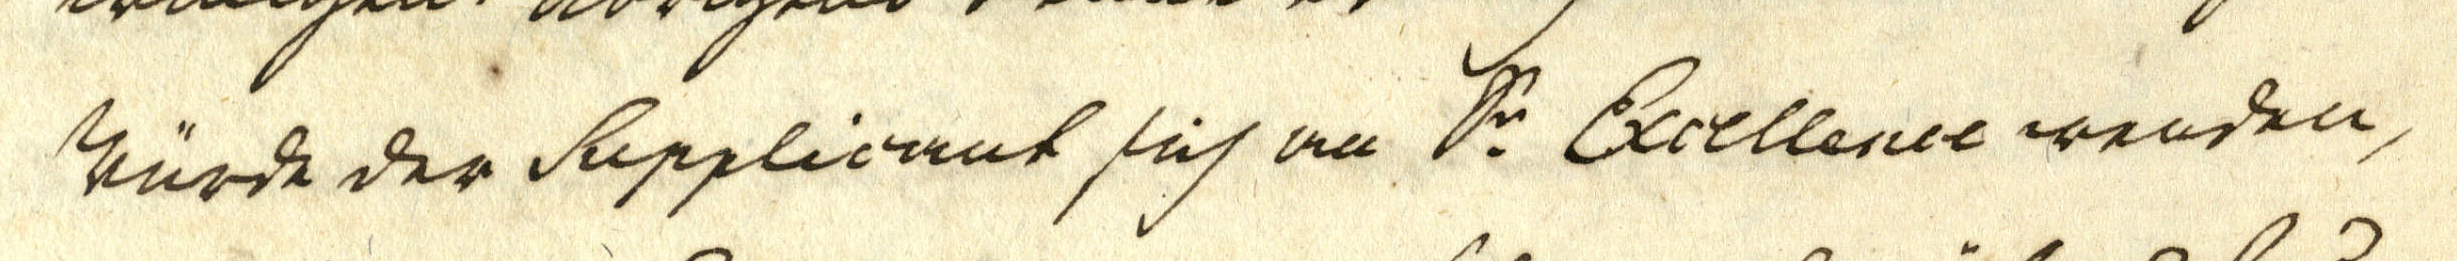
Würde der Supplicant sich an Sr. Excellence wenden,
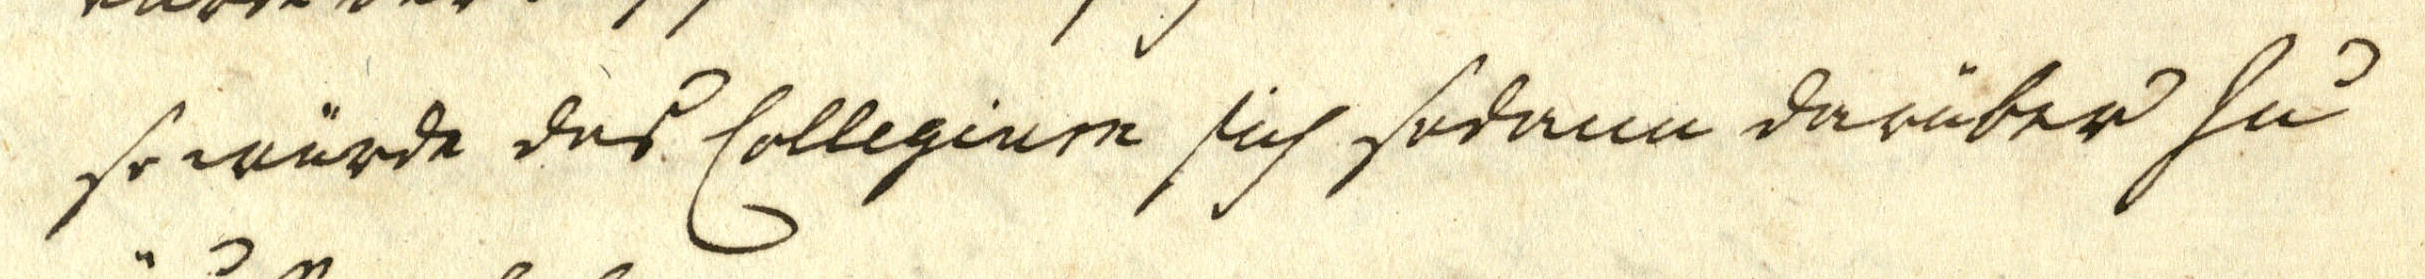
so würde das Collegium sich sodann darüber zu
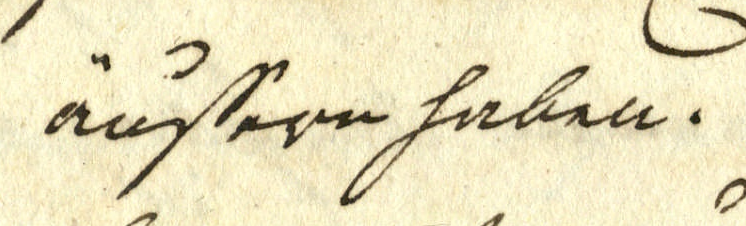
äussern haben.
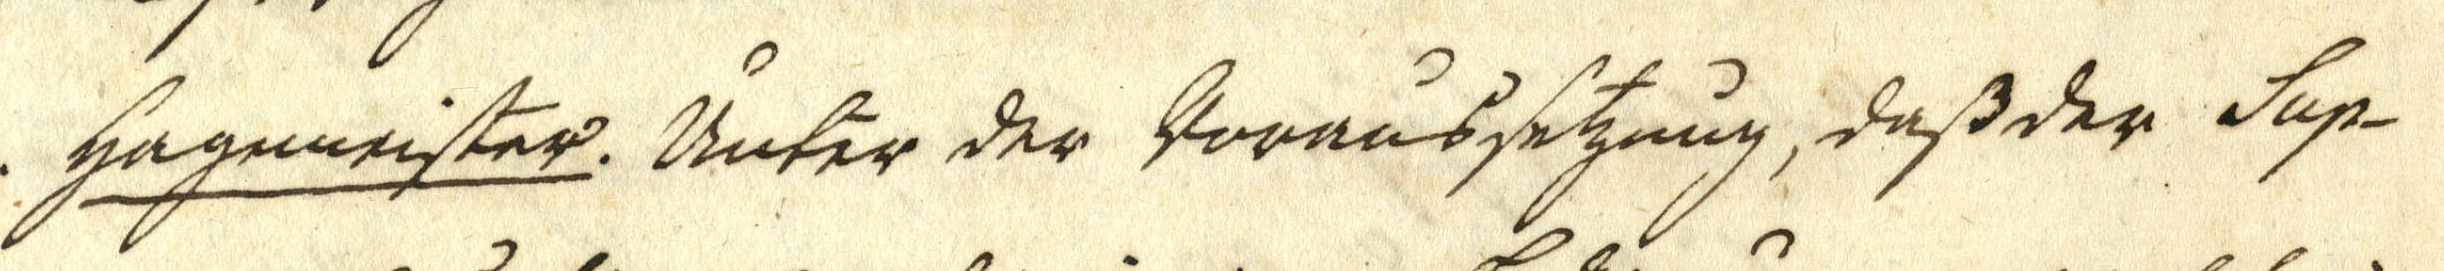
Hagemeister. Unter der Voraussetzung, daß der Sup¬
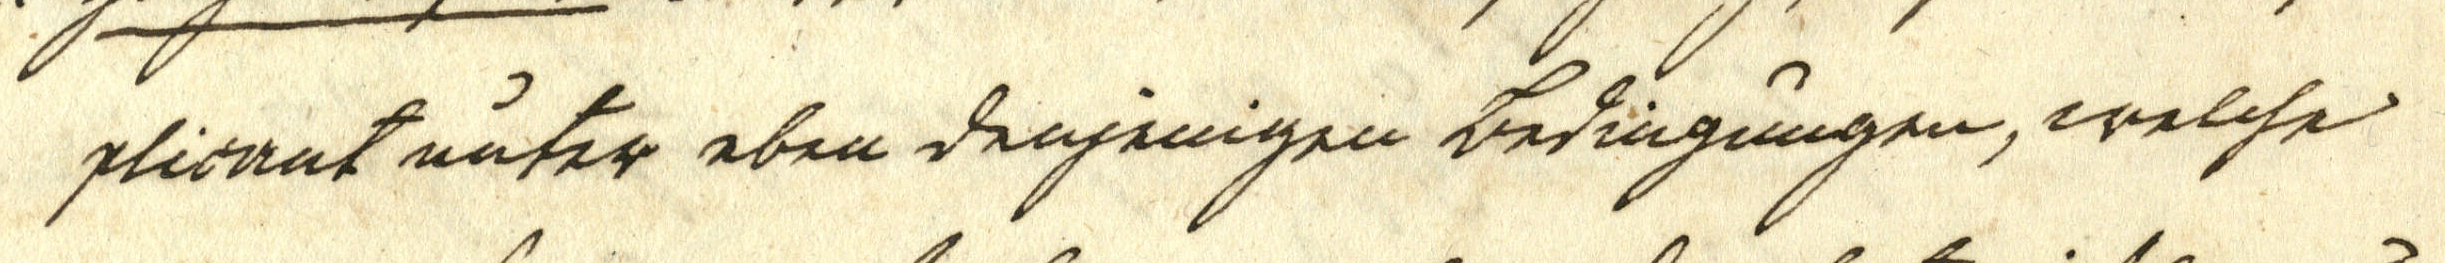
plicant unter eben denjenigen Bedingungen, welche
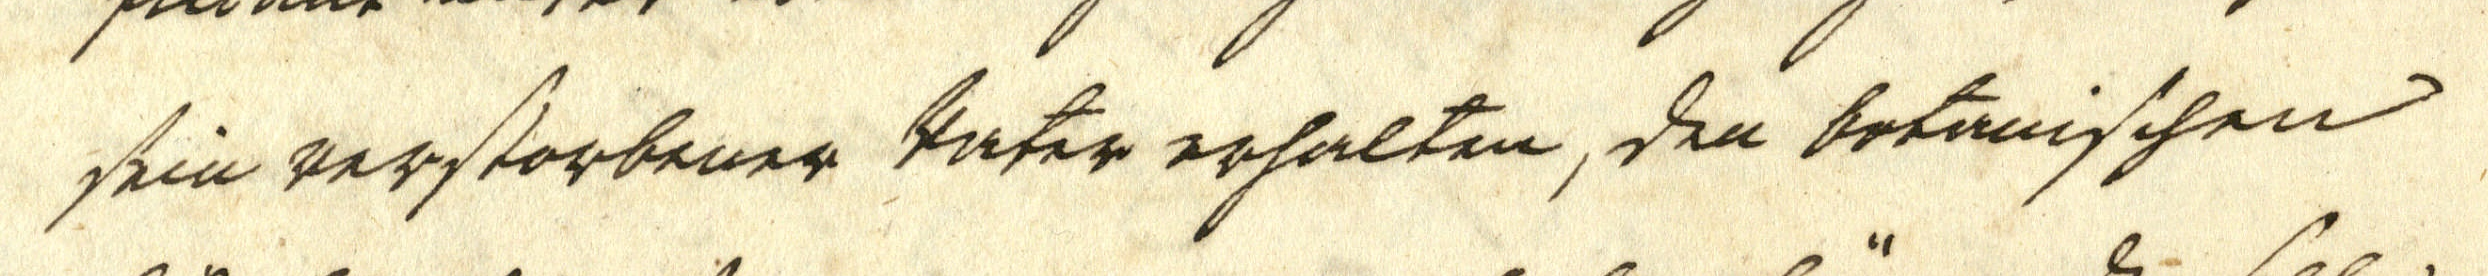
sein verstorbener Vater erhalten, den botanischen
